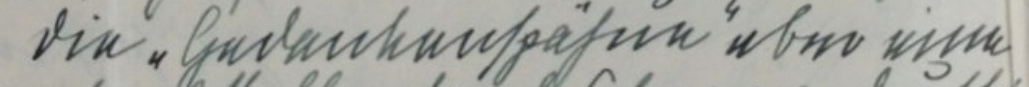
die „Gedankenspähne" über eine
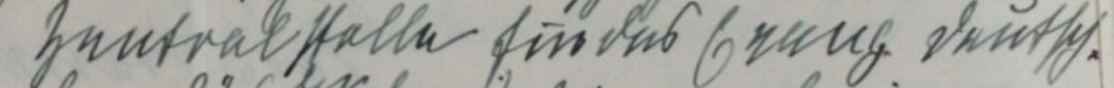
Zentrale Stelle für das Evang. Deutsch
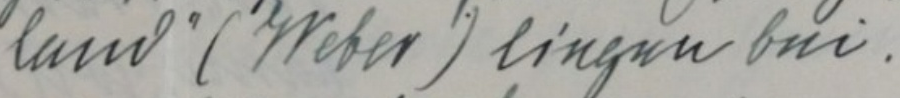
land (Weber) liegen bei.
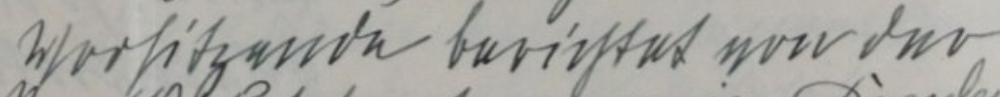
Vorsitzende berichtet von der
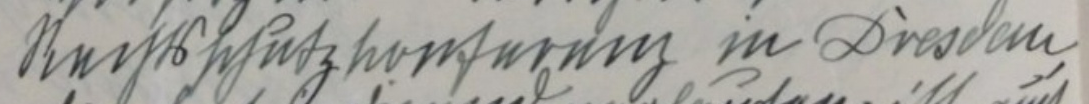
Rechtsschutzkonferenz in Dresden.
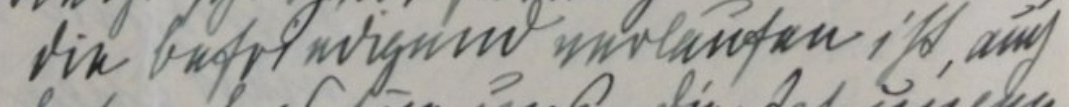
Die befriedigend verlaufen ist, auch
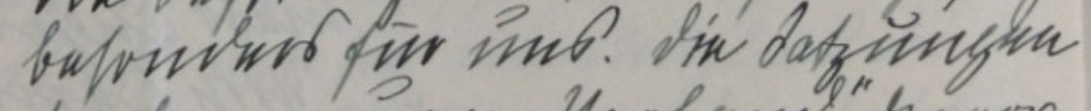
besonders für uns. Die Satzungen
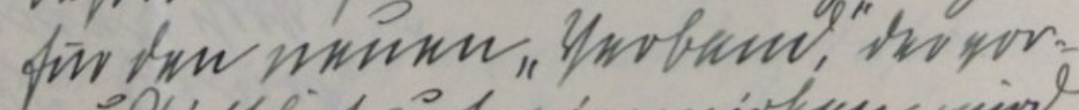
für den neuen „Verband" der vor
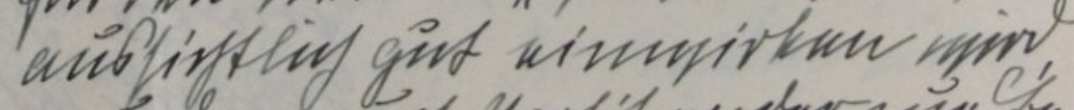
rausichtlich gut einwirken wird
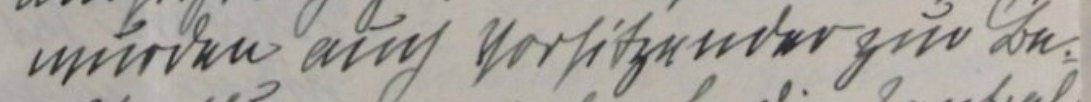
wurden auch Vorsitzender zur Be
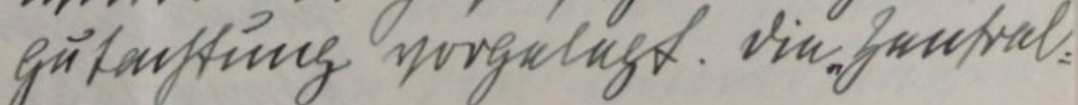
gutachtung vorgelegt. Die „Zentral
